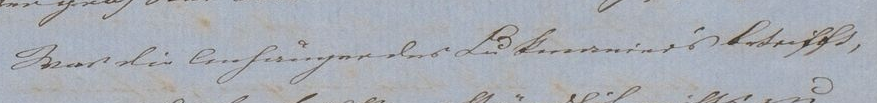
Was die Anhänger des Lukmanier's betrifft,
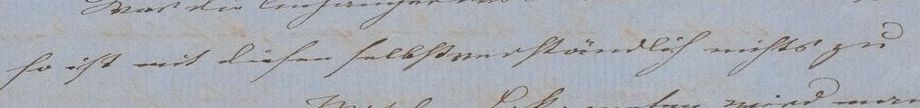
so ist mit diesen selbstverständlich nichts zu
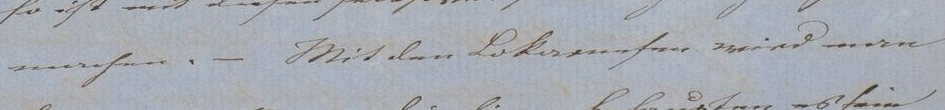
machen. – Mit den Lokarnesen wird man
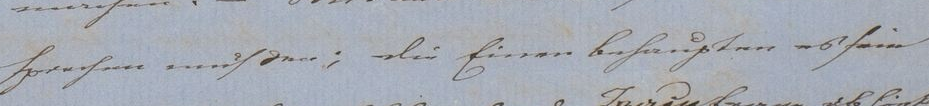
sprechen müssen; die Einen behaupten es seie
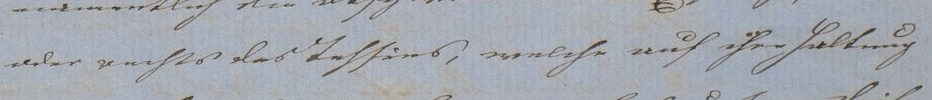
oder rechts des Tessins, welche auf ihre Haltung
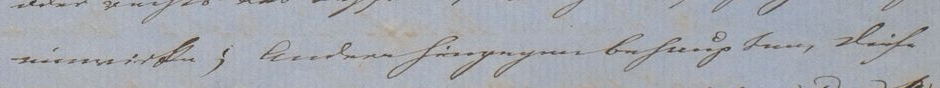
einwirke; Andere hingegen behaupten, diese
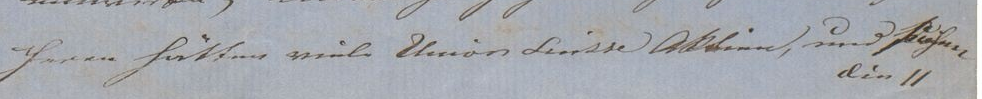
Herrn hätten viele Union Suisse Aktien, und suchen
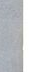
die
